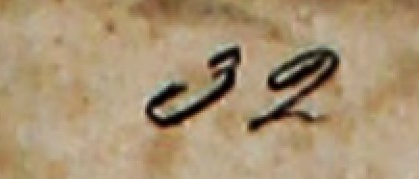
32
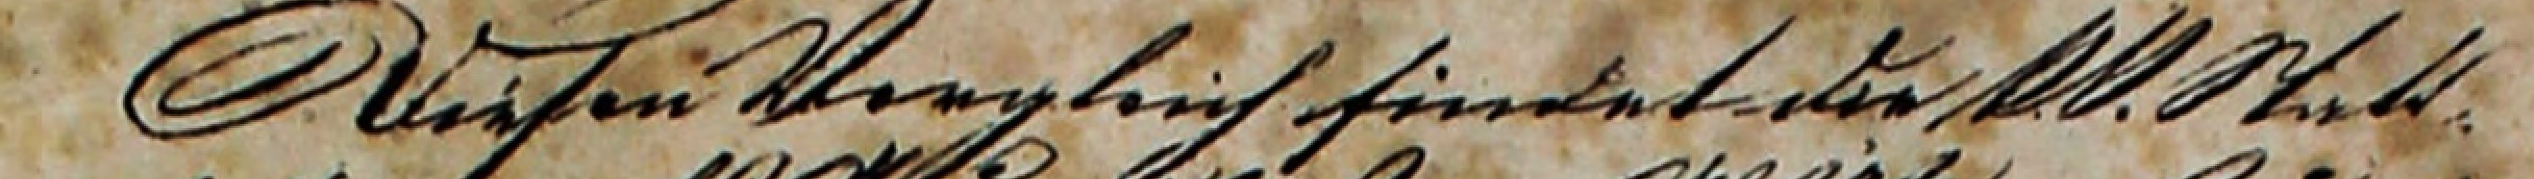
Fiesen Vergleich findet die k.k. Stadt„
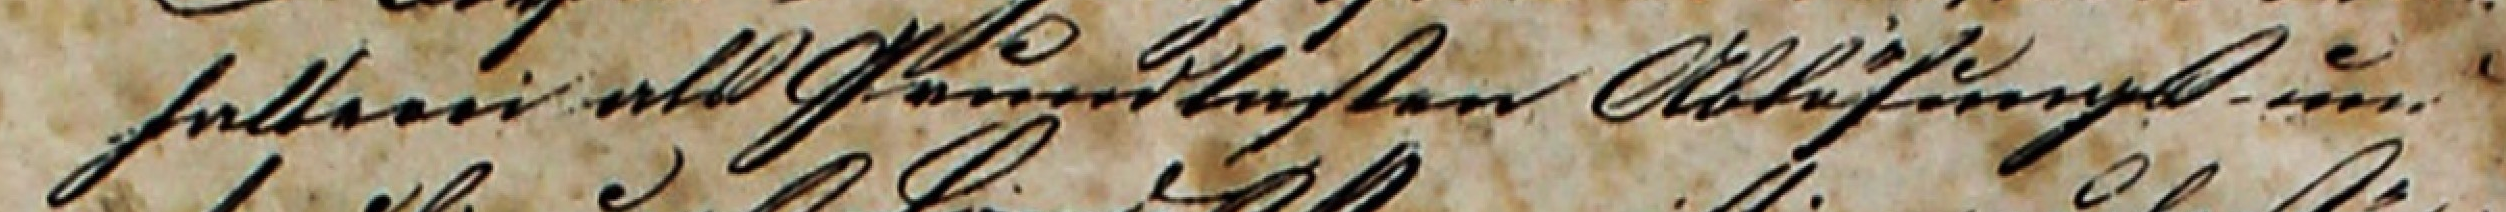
halterei als Grundlasten Ablösungs- und
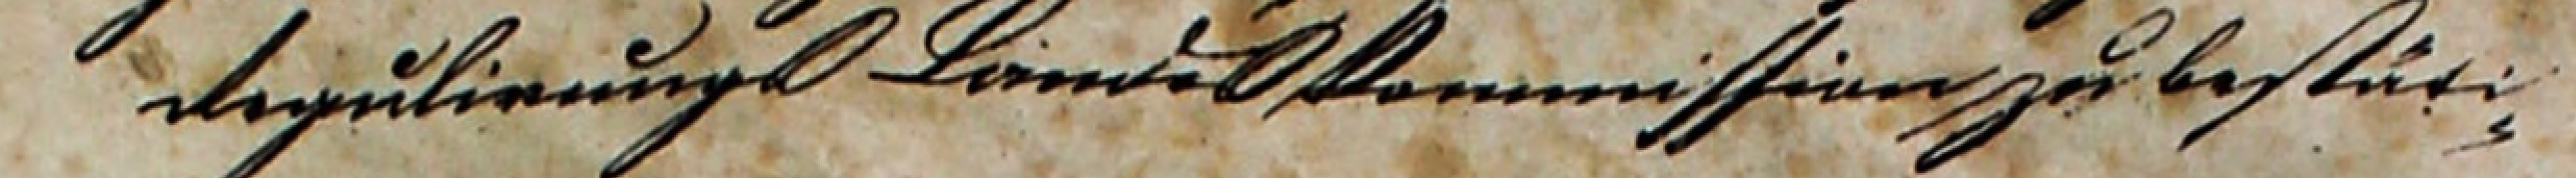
degulirungs Landes Kommission zu bestäti„
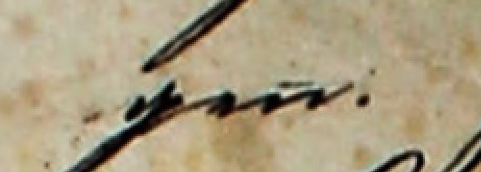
gen.
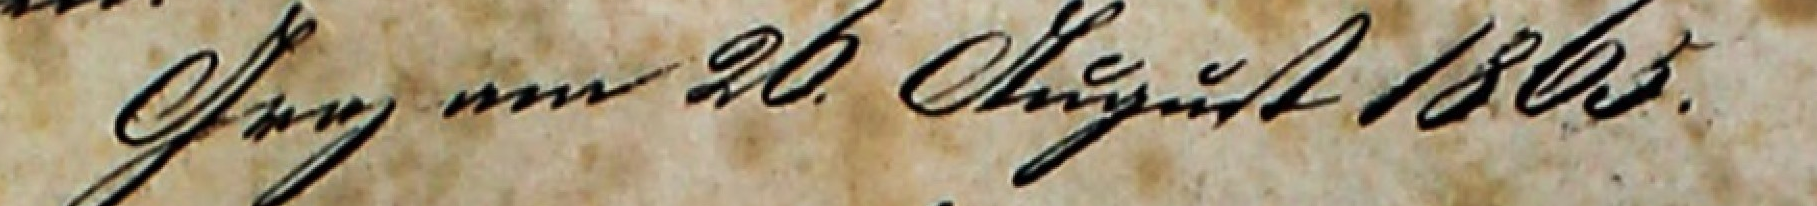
Groz am 26. August 1865.
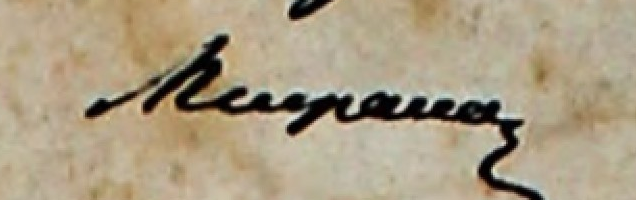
Nunana
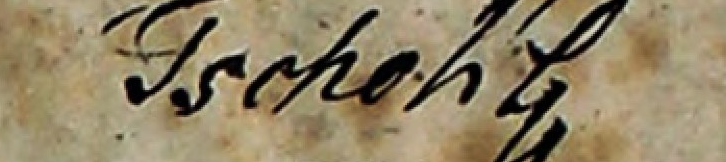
??? Tscho???
